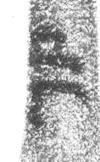天
